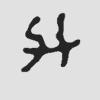兵
